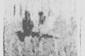廿
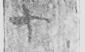七
